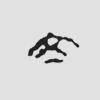{文一}
